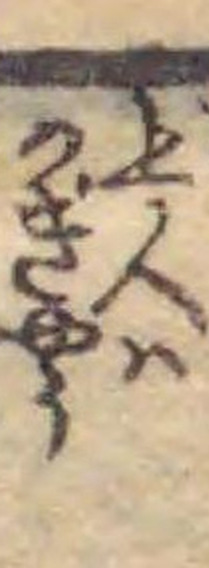かぎやう
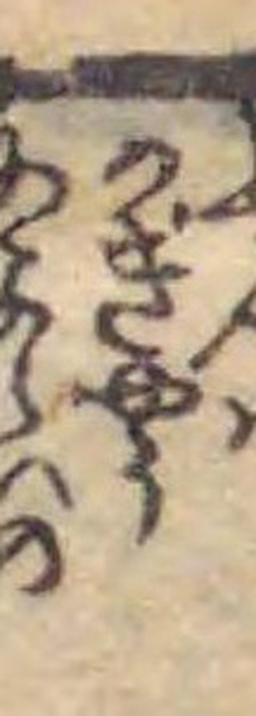によらいの
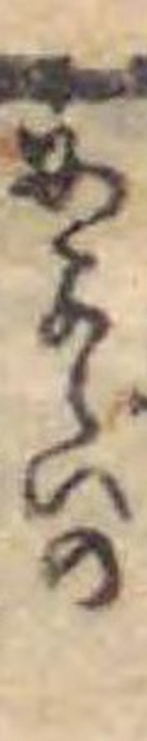によらいの
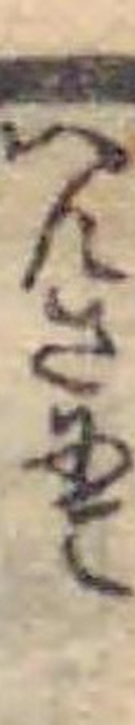へんさにて
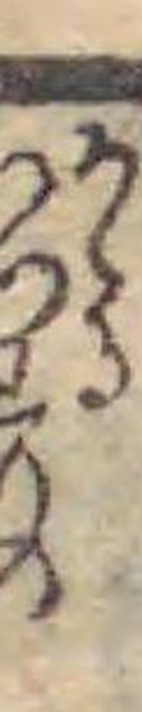いつわりの
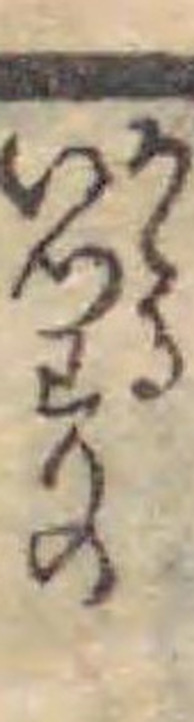いつわりの
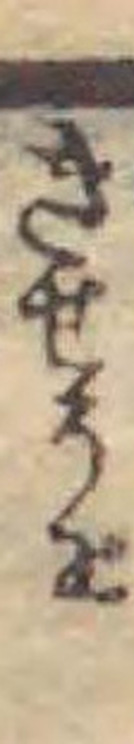きせうを
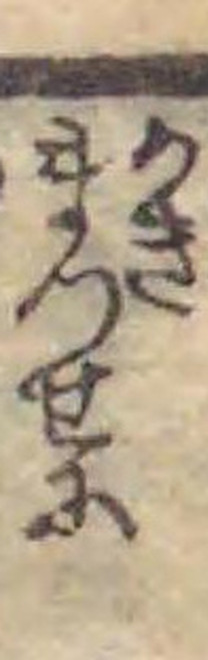まつせに
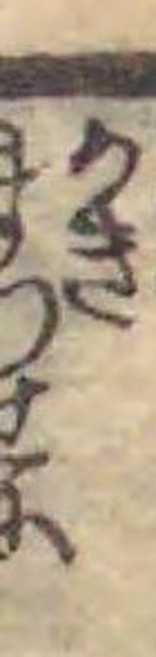まつせに
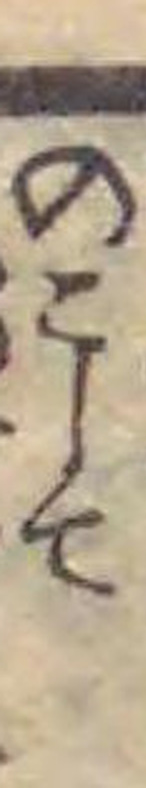のこして
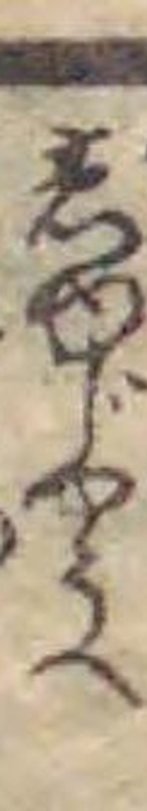しゆじやうへ
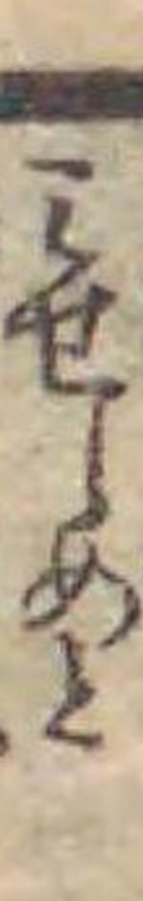みせしめと
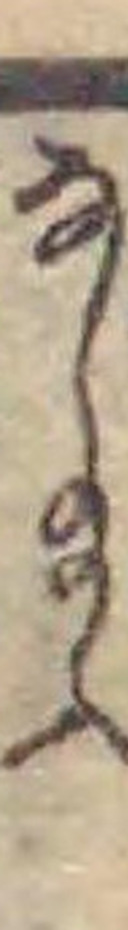なし給ふ
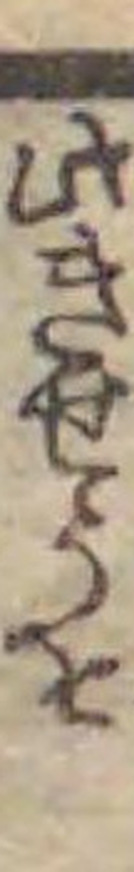此きせうを
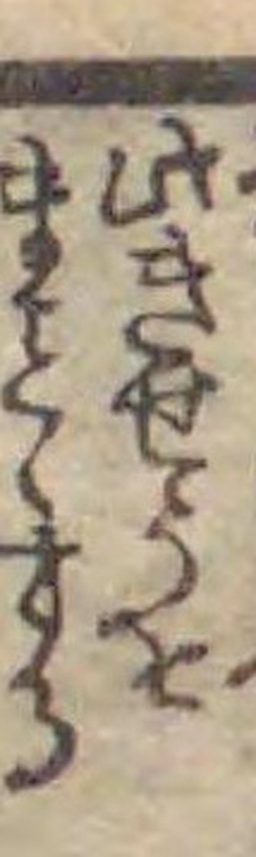まことゝする
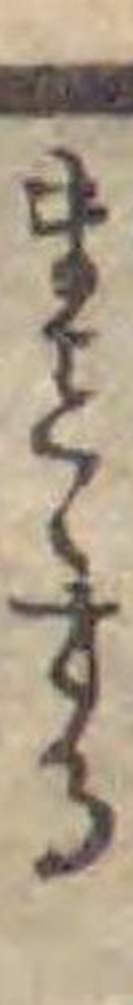まことゝする
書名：身体開帳略縁起 : 3巻
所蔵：国立国会図書館 National Diet Library, JAPAN
